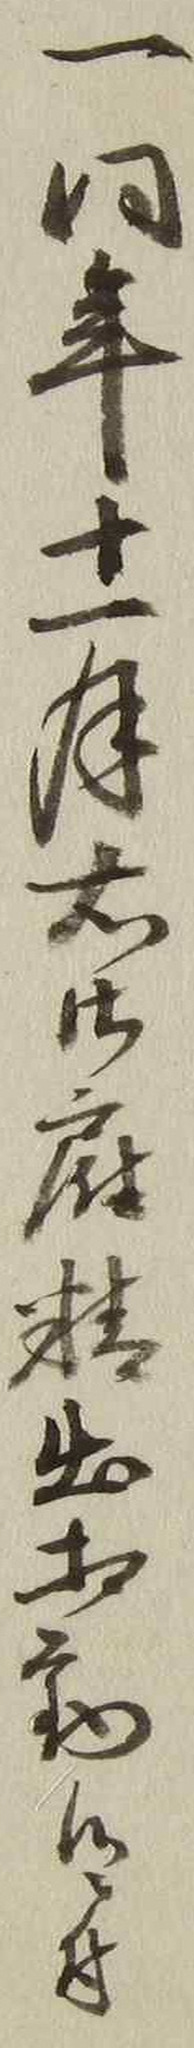一同年十一月右御雇精出相勤候ニ付
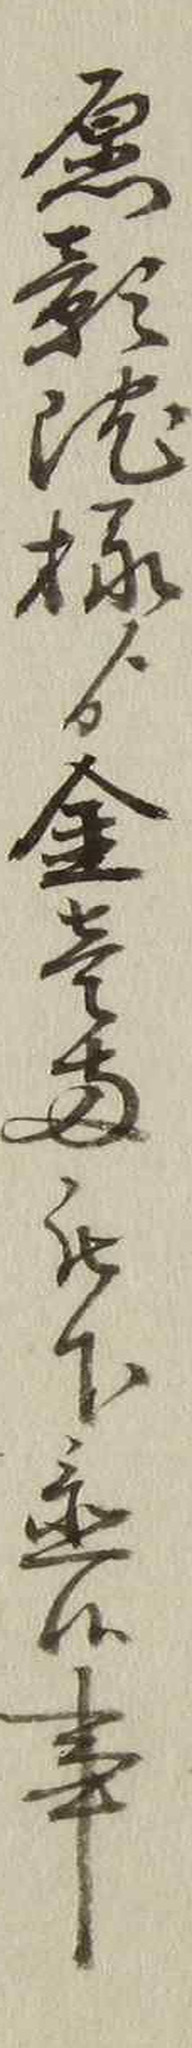愿彰院ゟ金壱両被下置候事
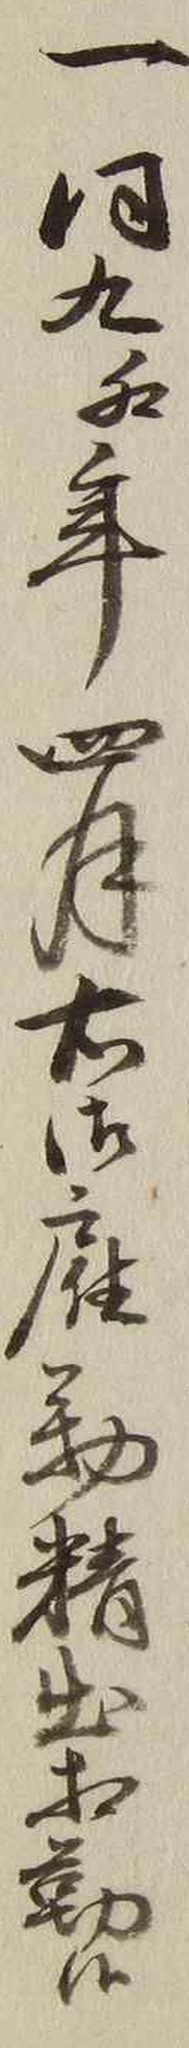一同九卯年四月右御雇勤精出相勤候
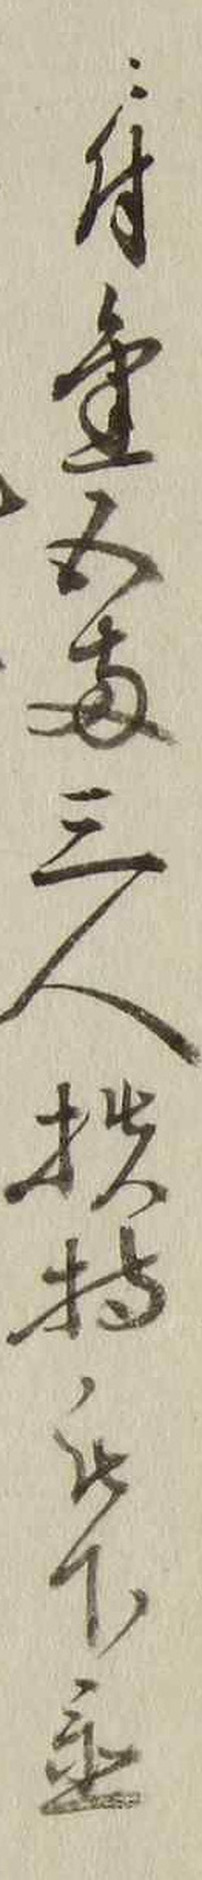ニ付金五両三人扶持被下置
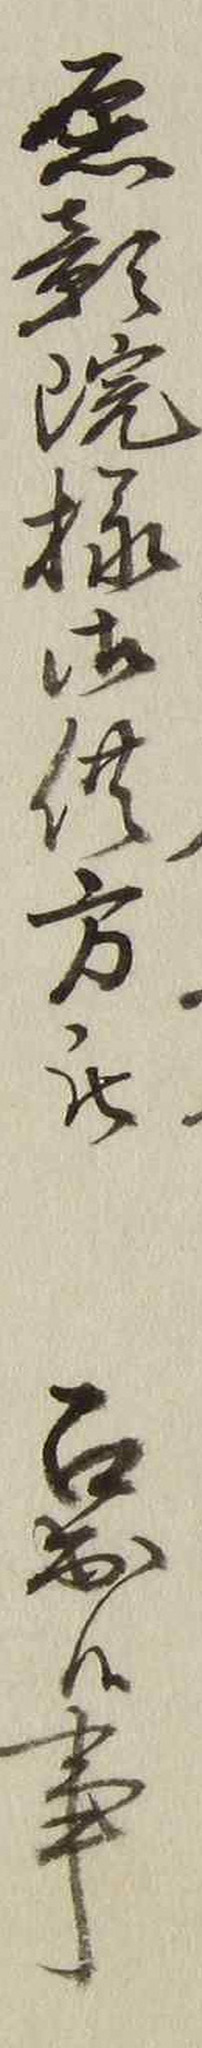愿彰院様御供方被召出候事
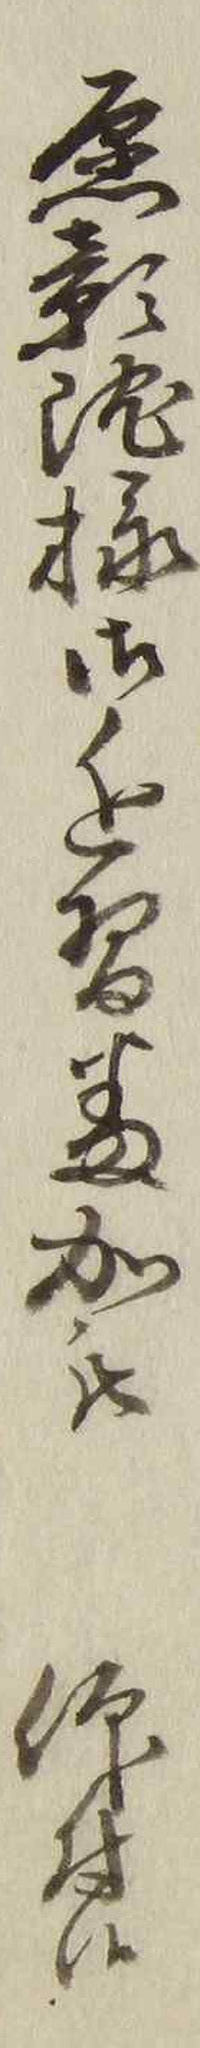愿彰院様御近習番加被仰付候

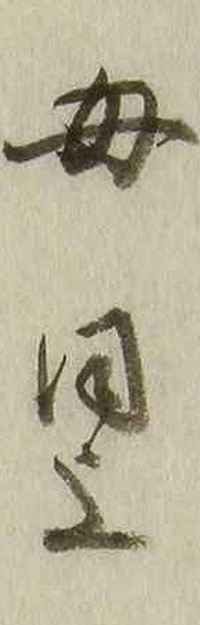母堂上
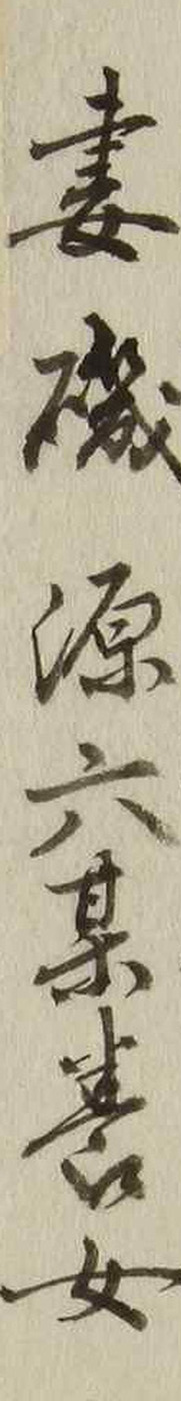妻磯源六某養女
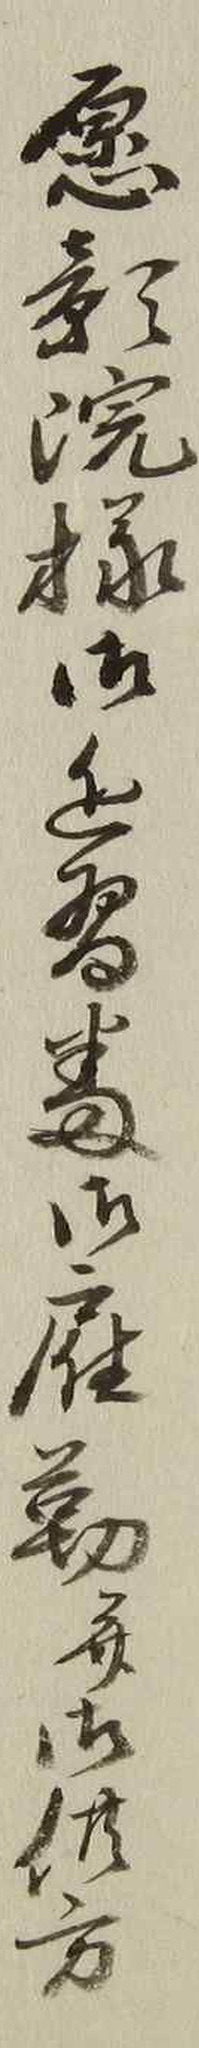愿彰院様御近習番御雇勤并御供方
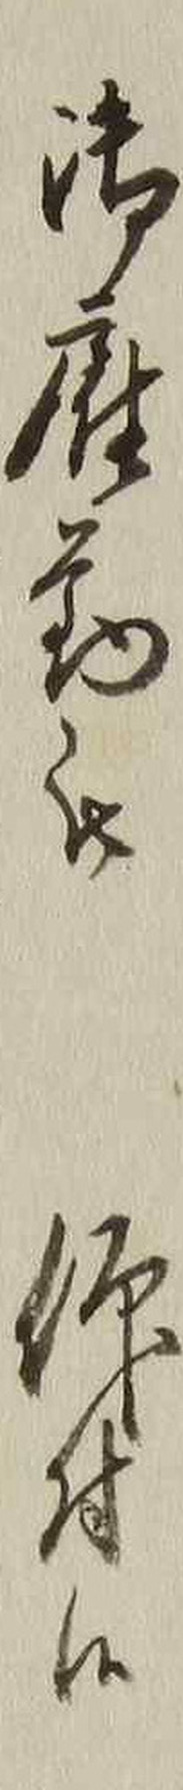御雇勤被仰付候
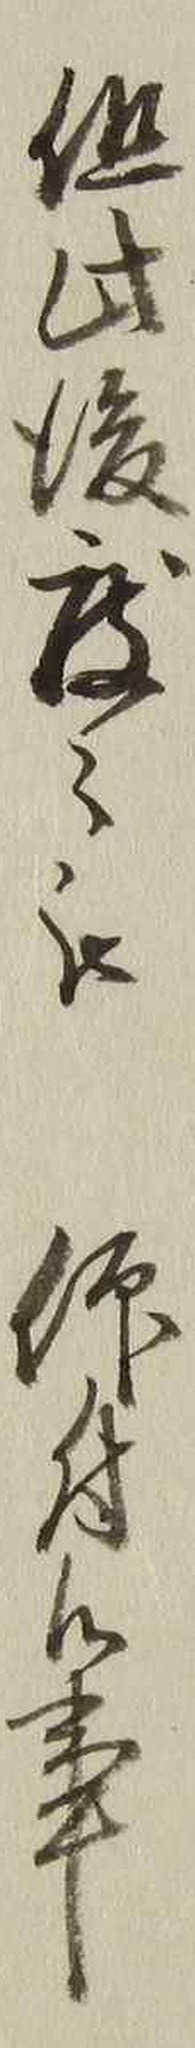但此後度々被仰付候事
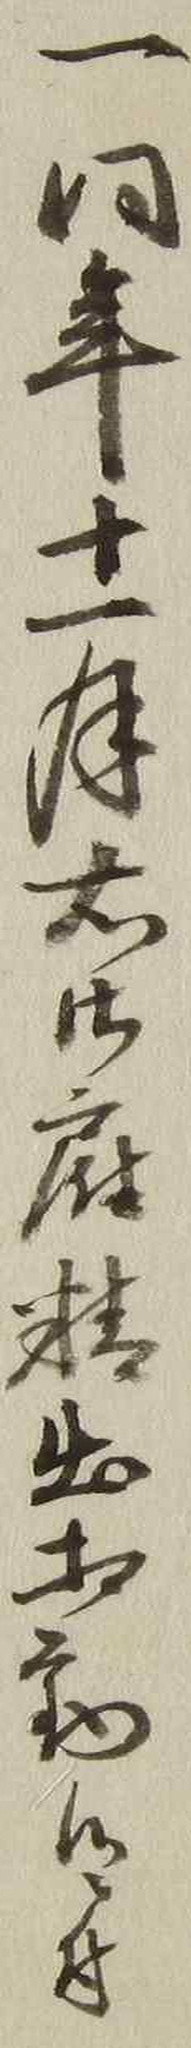一同年十一月右御雇精出相勤候ニ付
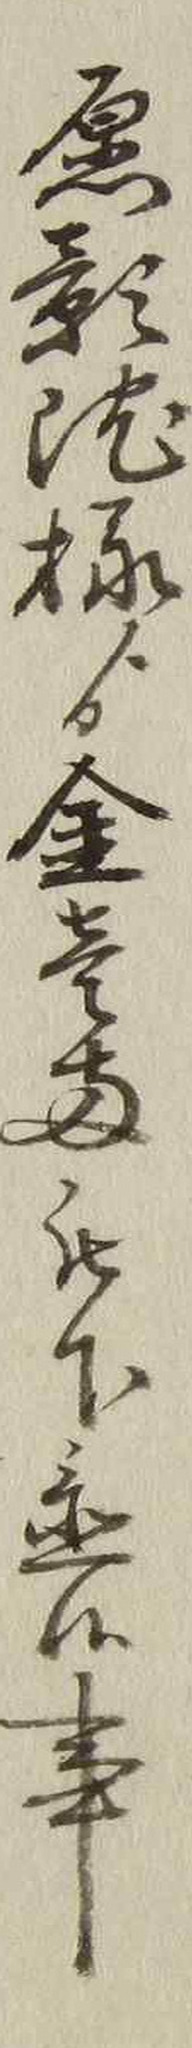愿彰院様御ゟ金壱両被下置候事
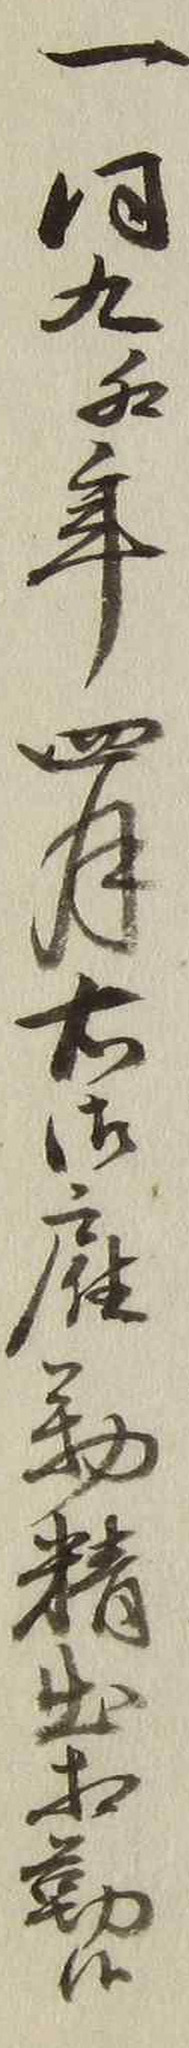一同九卯年四月右御雇勤精出相勤候
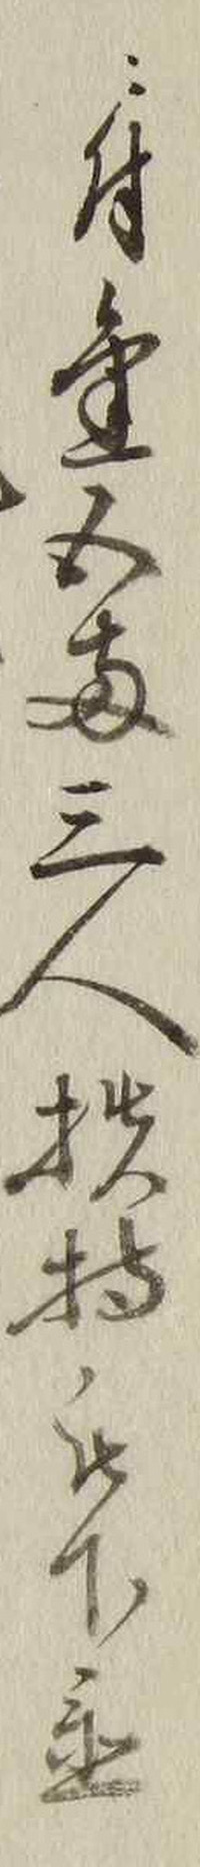ニ付金五両三人扶持被下置
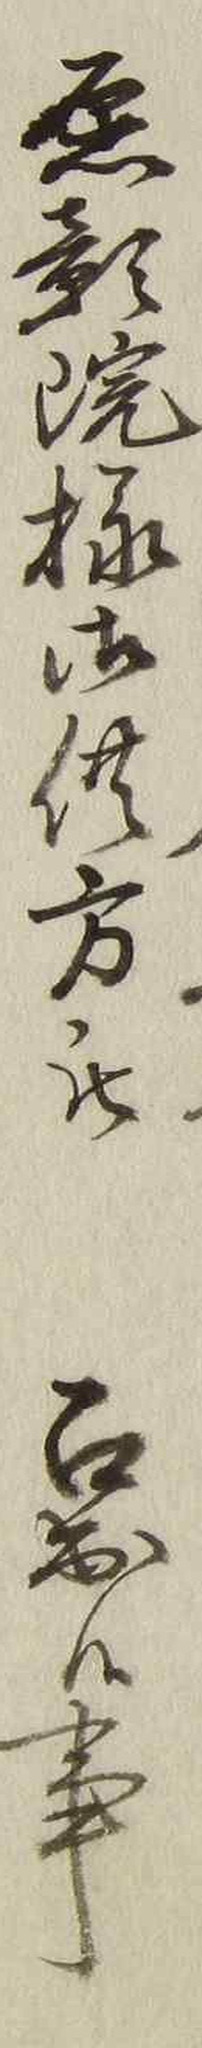愿彰院様御供方被召出候事
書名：諸士系譜　巻之31　い之部31
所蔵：会津若松市立会津図書館
